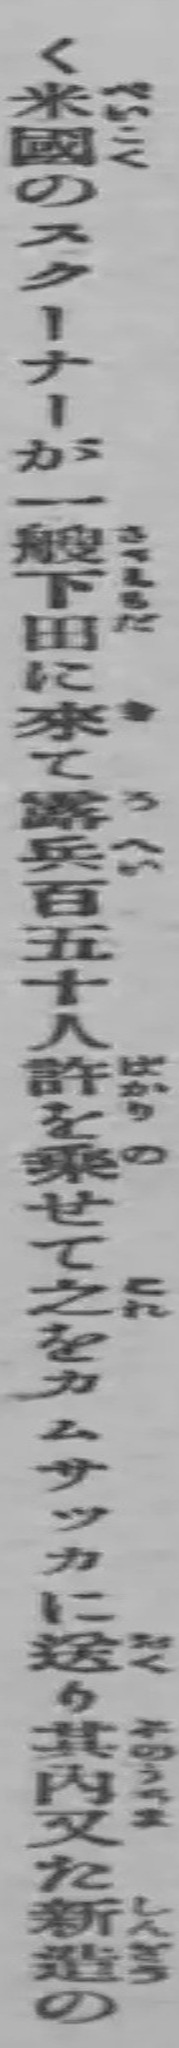く米国のスクーナーが一艘下田に来て露兵百五十人許を乗せて之をカムサツカに送り其内又た新造の
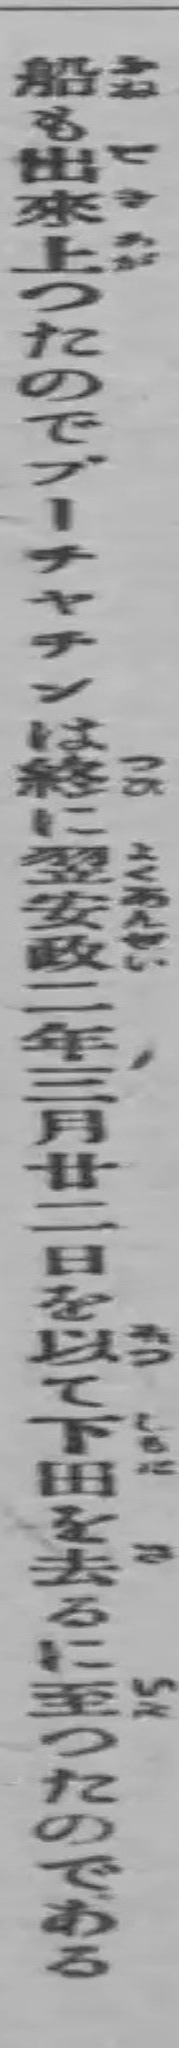船も出来上つたのでプーチヤチンは終に翌安政二年三月廿二日を以て下田を去るに至つたのである
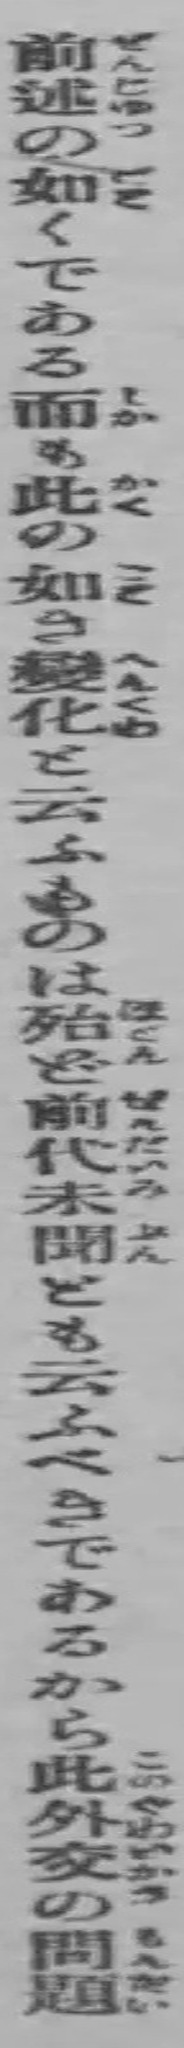前述の如くである而も此の如き変化と云ふものは殆ど前代未聞とも云ふべきであるから此外交の問題
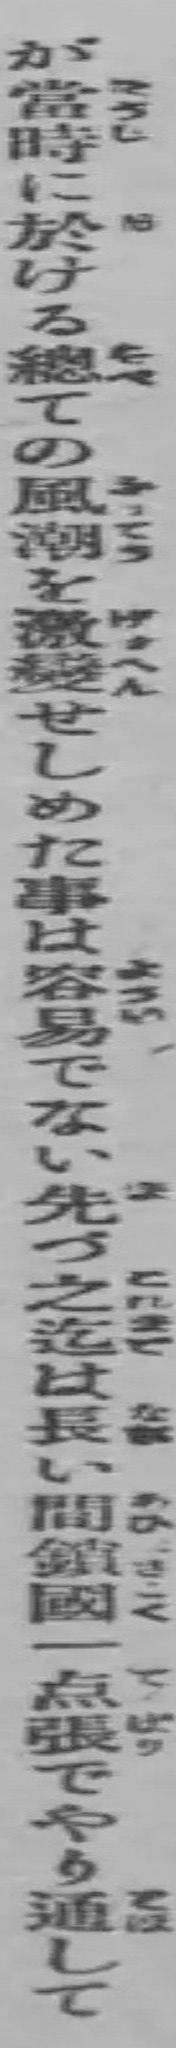が当時に於ける総ての風潮を激変せしめた事は容易でない先づ之迄は長い間鎖国一点張でやり通して
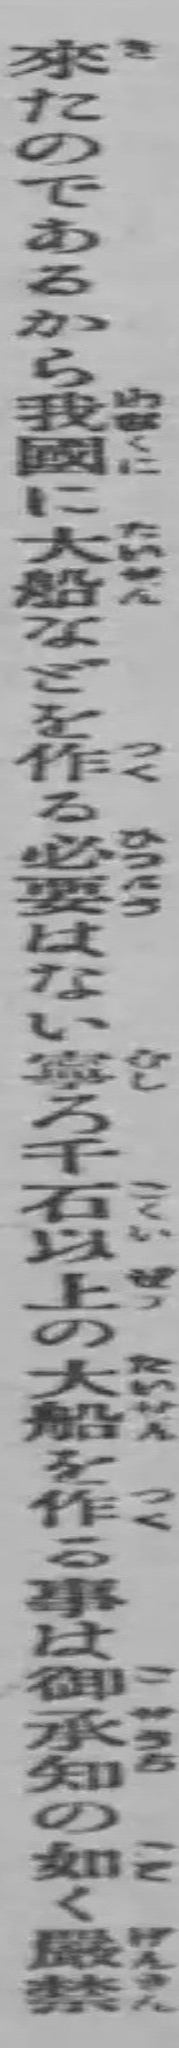来たのであるから我国に大船などを作る必要はない寧ろ千石以上の大船を作る事は御承知の如く厳禁
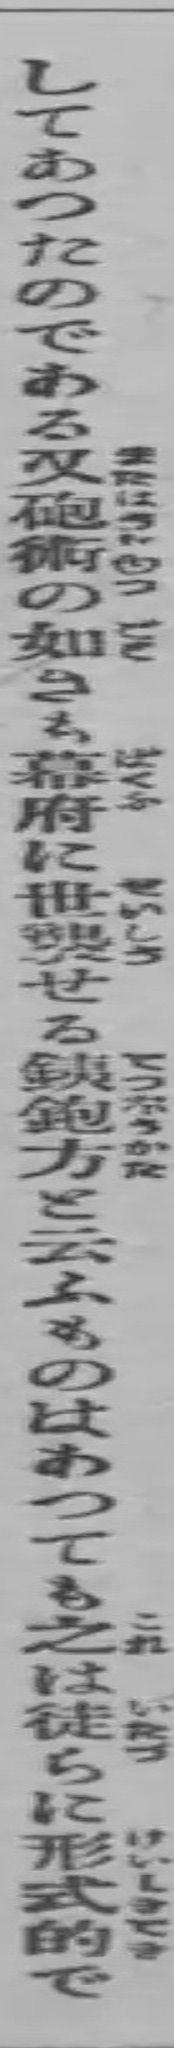してあつたのである又砲術の如きも幕府に世襲せる鉄砲方と云ふものはあつても之は徒らに形式的で
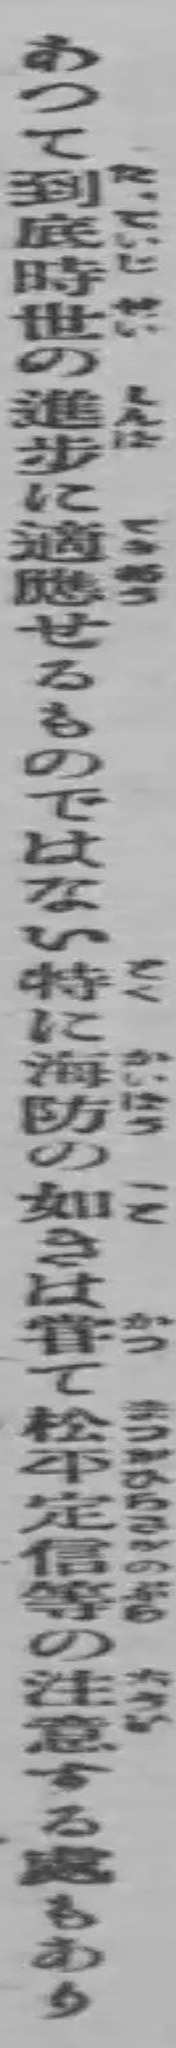あつて到底時世の進歩に適応せるものではない特に海防の如きは嘗て松平定信等の注意する処もあり
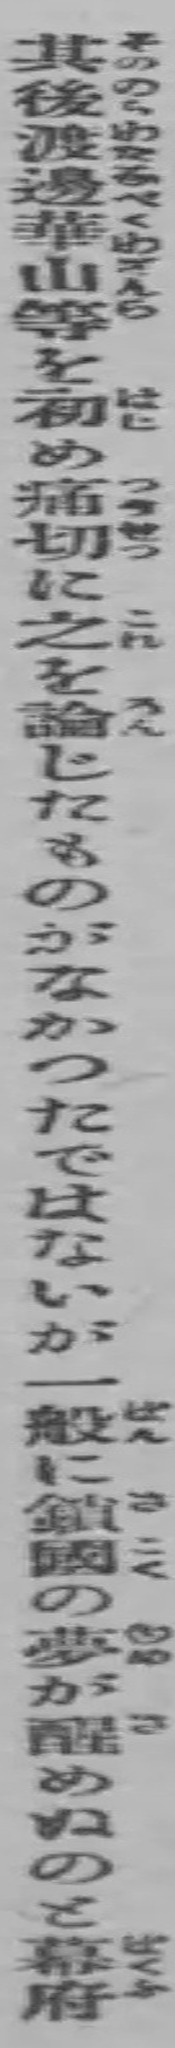其後渡辺崋山等を初め痛切に之を論じたものがなかつたではないが一般に鎖国の夢が醒めぬのと幕府
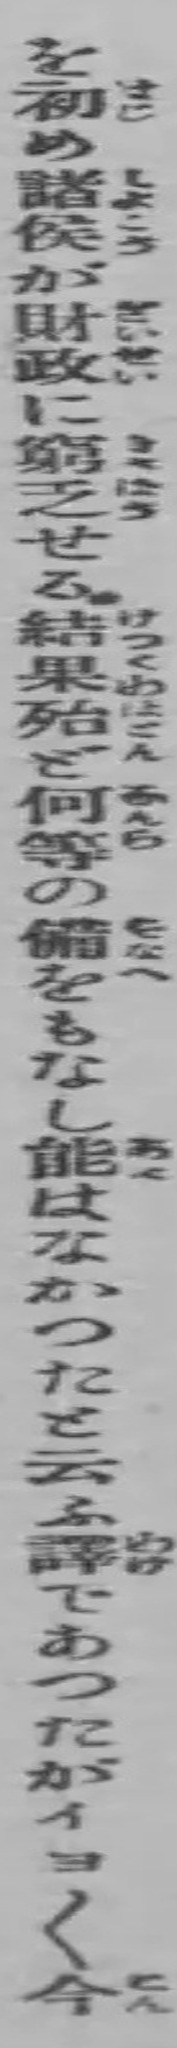を初め諸侯が財政に窮乏せる結果殆ど何等の備をもなし能はなかつたと云ふ訳であつたがイヨ〳〵今
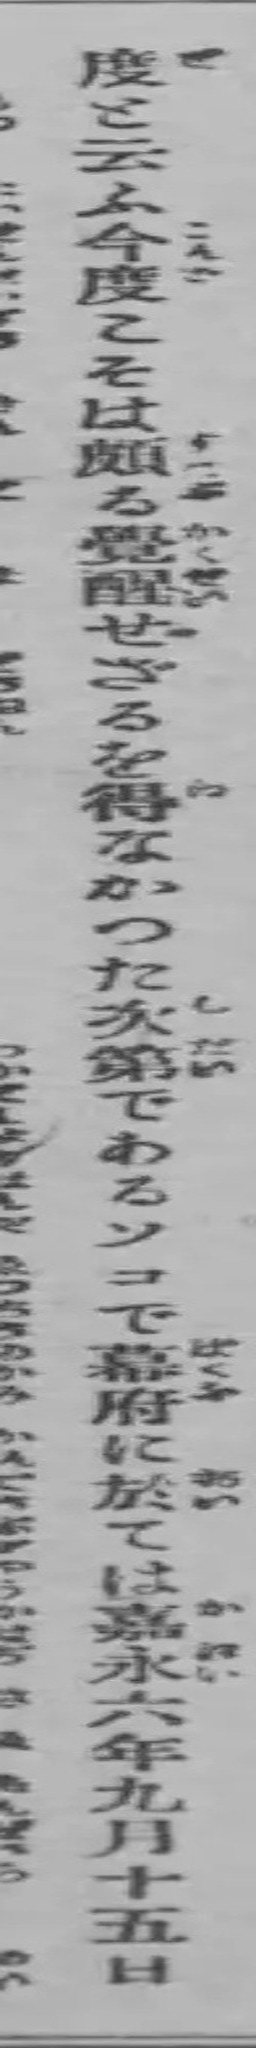度と云ふ今度こそは頗る覚醒せざるを得なかつた次第であるソコで幕府に於ては嘉永六年九月十五日
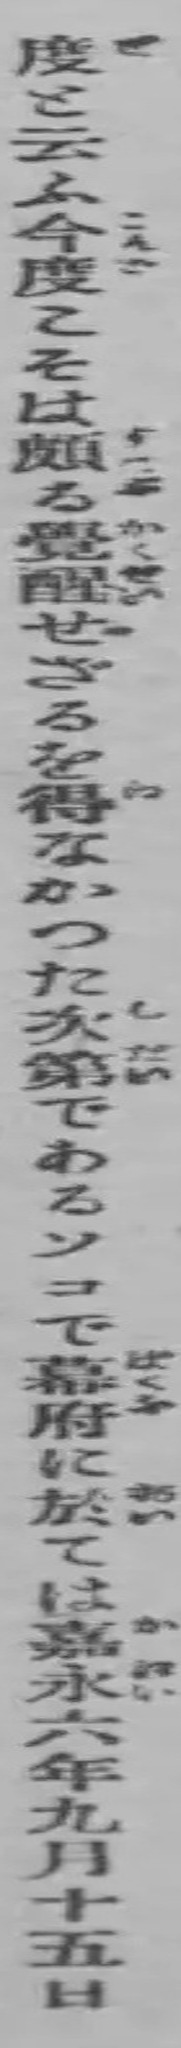度と云ふ今度こそは頗る覚醒せざるを得なかつた次第であるソコで幕府に於ては嘉永六年九月十五日
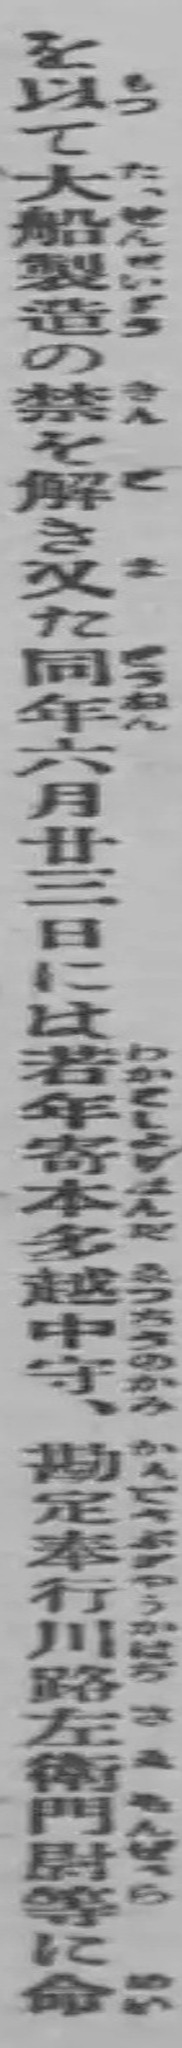を以て大船製造の禁を解き又た同年六月廿三日には若年寄本多越中守、勘定奉行川路左衛門尉等に命
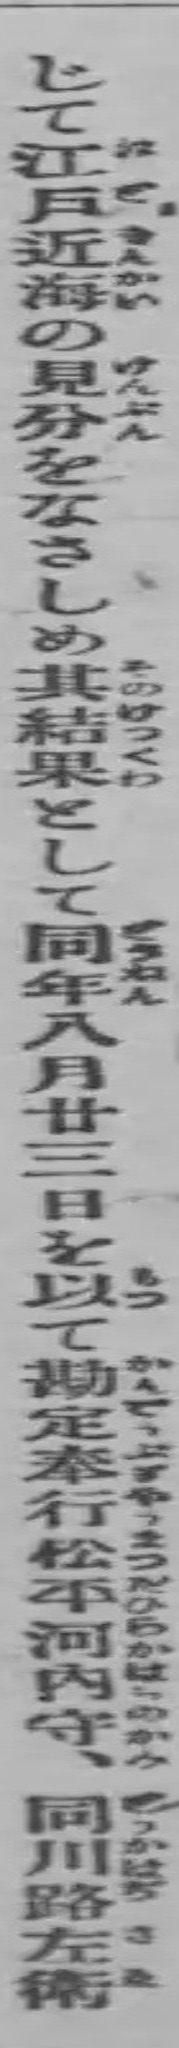じて江戸近海の見分をなさしめ其結果として同年八月廿三日を以て勘定奉行松平河内守、同川路左衛
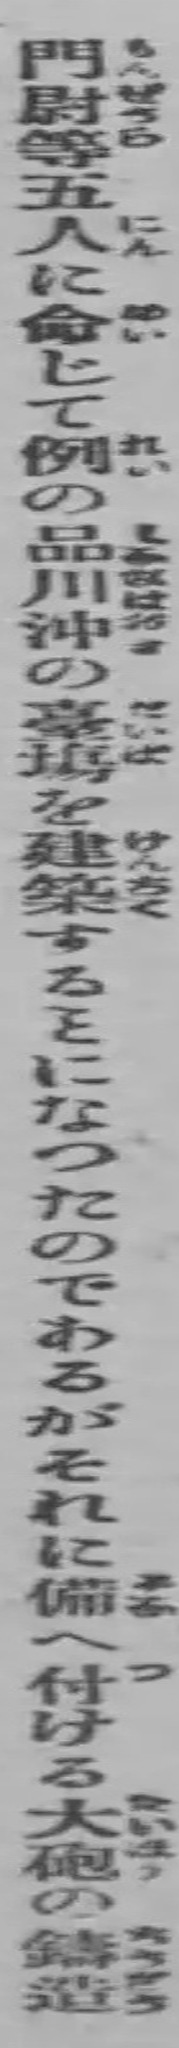門尉等五人に命じて例の品川沖の台場を建築することになつたのであるがそれに備へ付ける大砲の鋳造
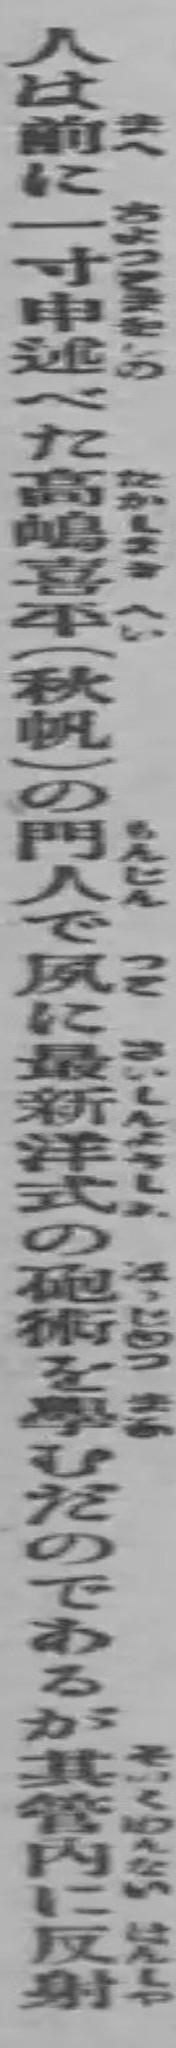人は前に一寸申述べた高嶋喜平(秋帆)の門人で夙に最新洋式の砲術を学むだのであるが其管内に反射

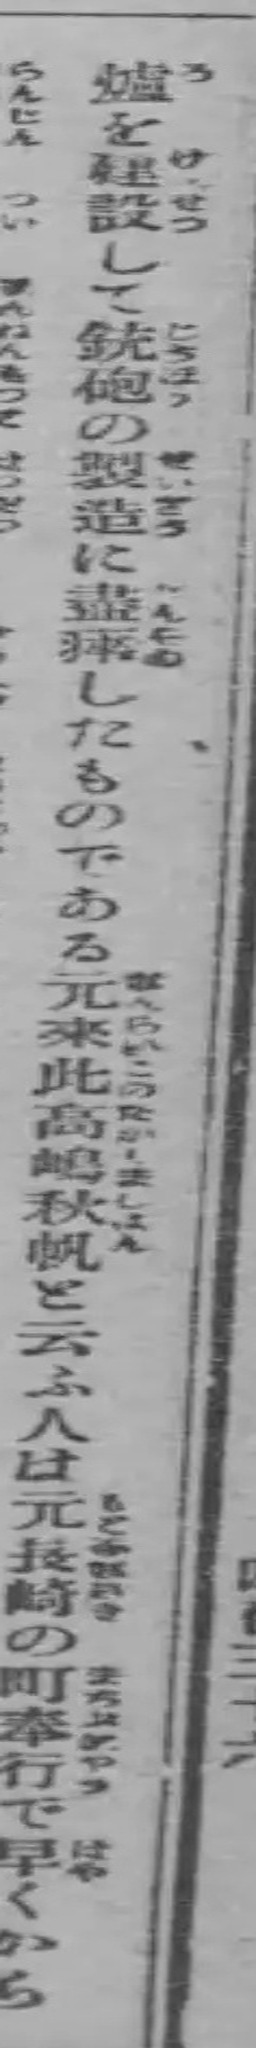高嶋秋帆炉を建設して銃砲の製造に尽瘁したものである元来此高嶋秋帆と云ふ人は元長崎の町奉行で早くから
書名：豊橋市史談
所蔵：国立国会図書館 National Diet Library, JAPAN
